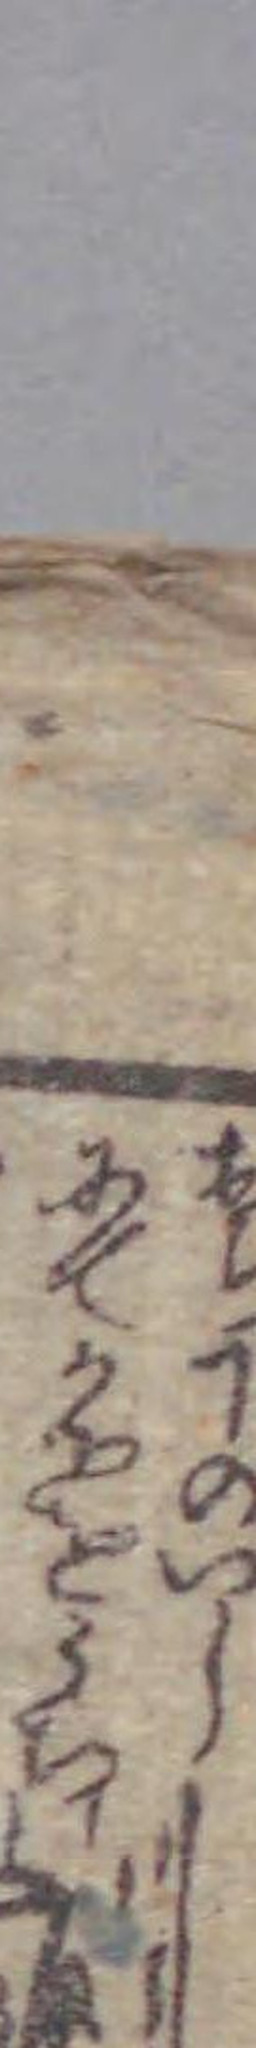にてかほをうち
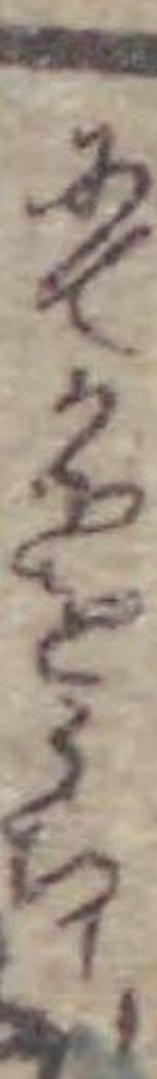にてかほをうち
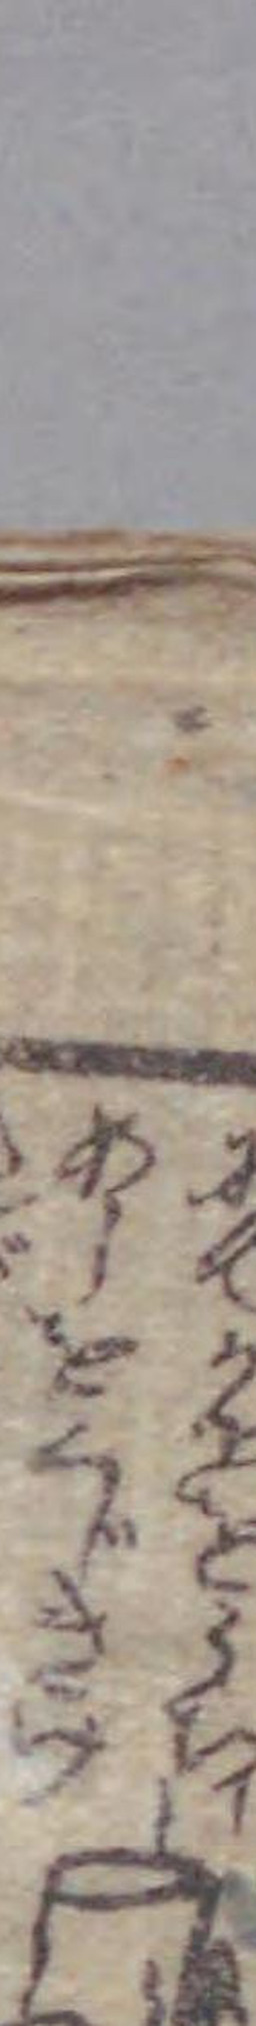あしをくじきけ
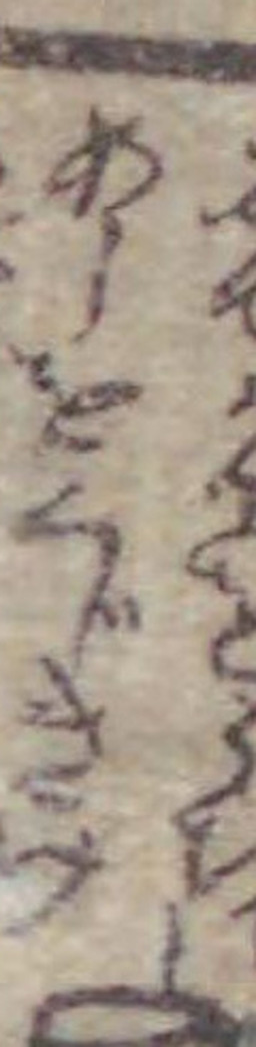あしをくじきけ
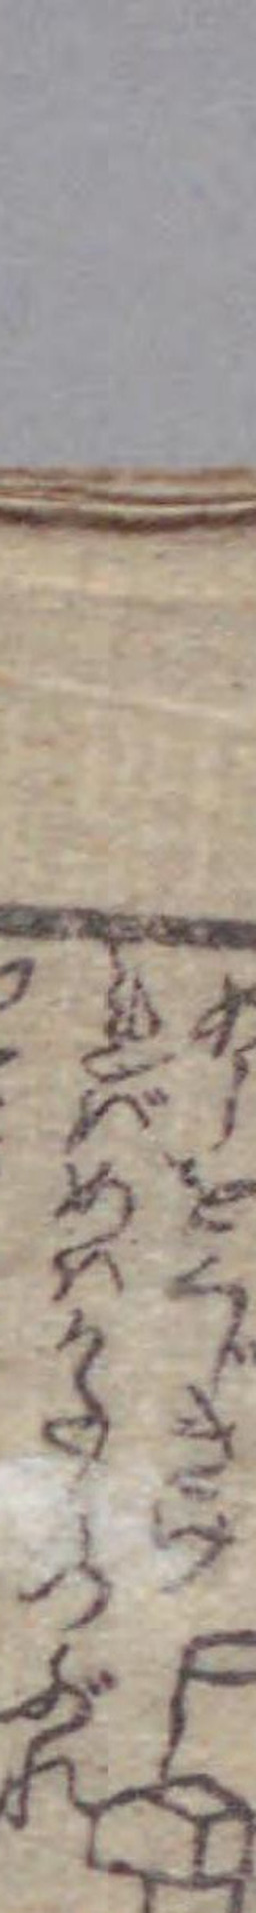ればめはかたくつぶれ
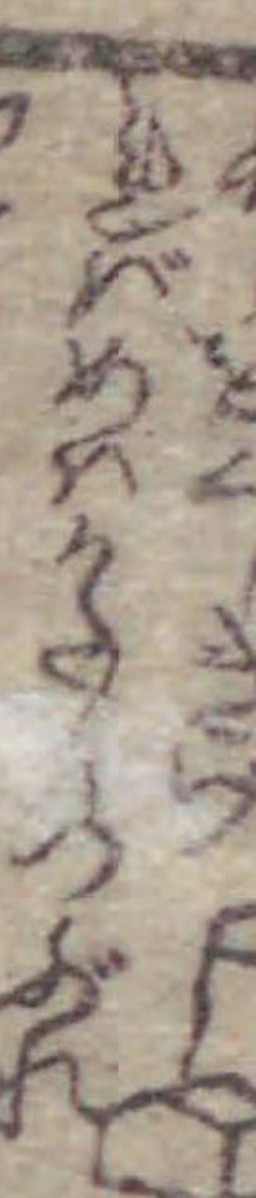ればめはかたくつぶれ
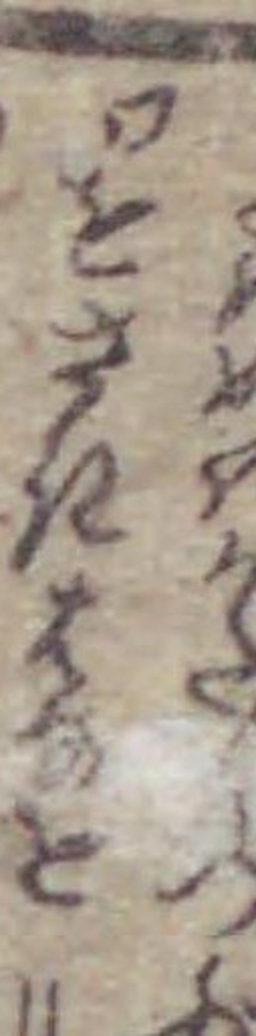口をさきはなを
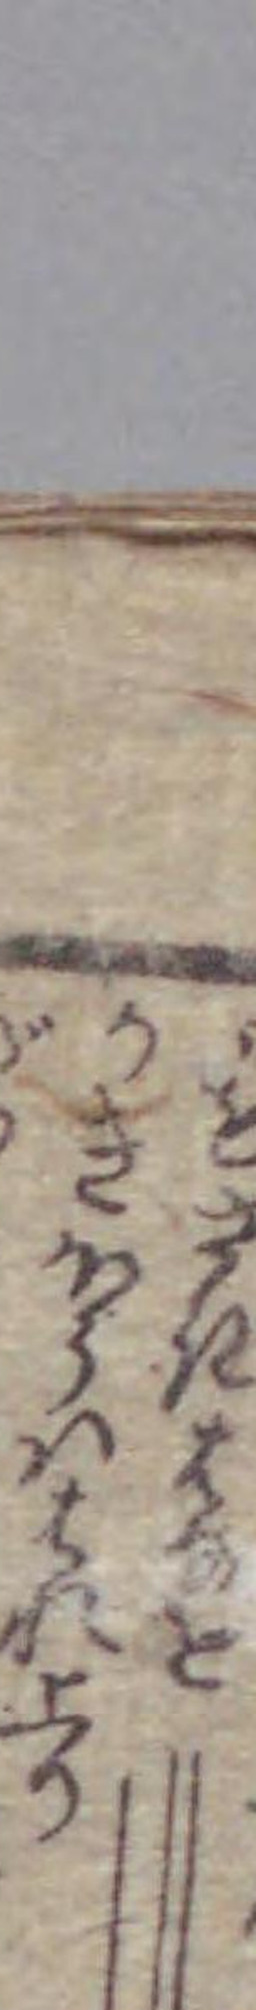かきほうははれ上り
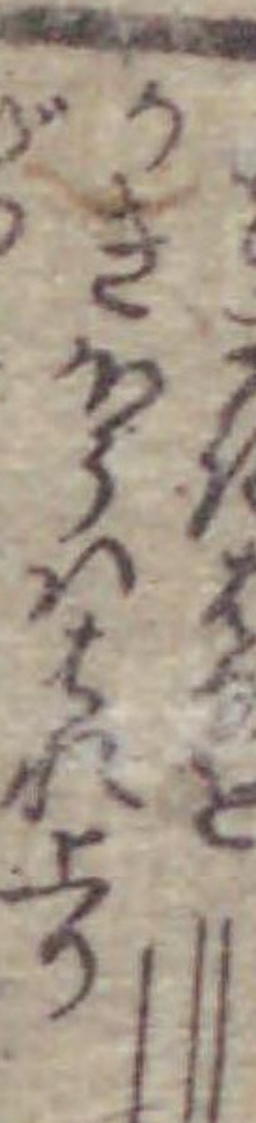かきほうははれ上り
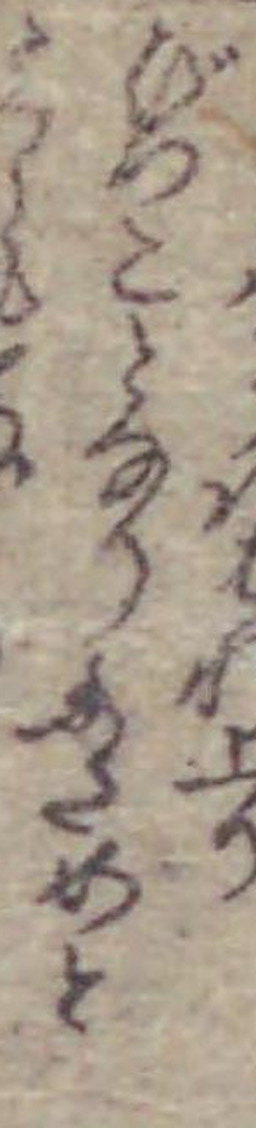びつことなりふためと
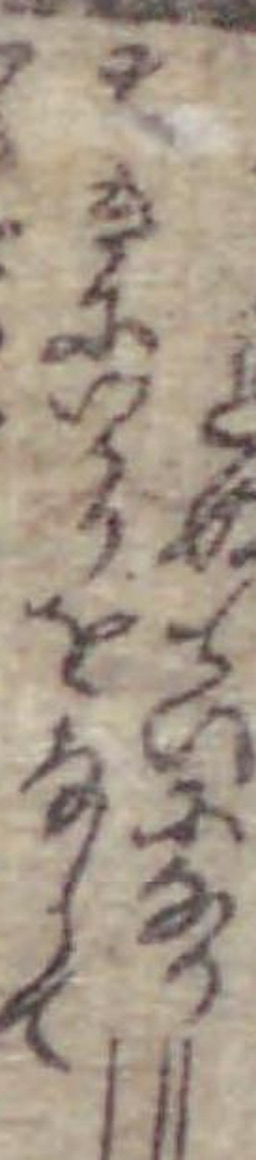大きにいかりをなして
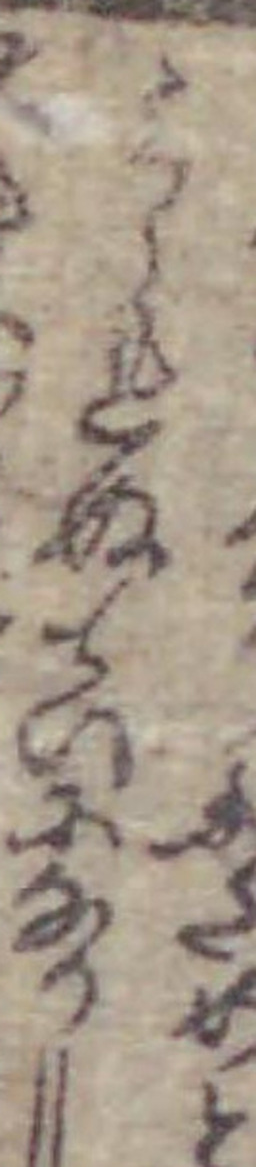みられぬていになり
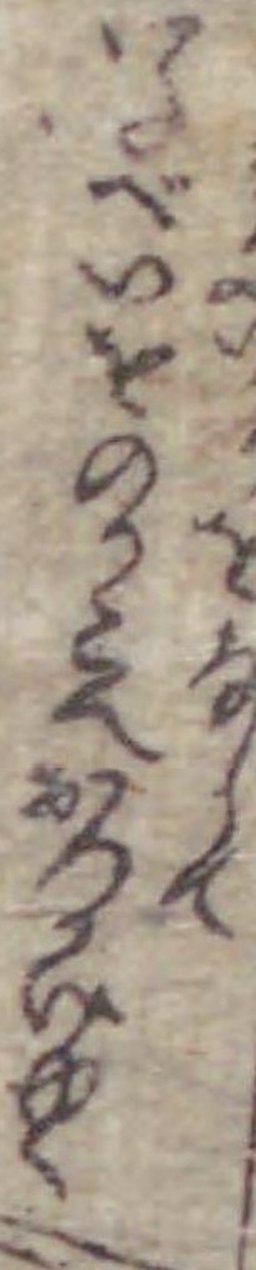いたべいをのりこへおつかけゆく
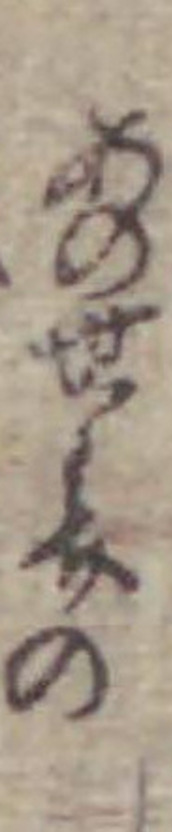あの世之介の
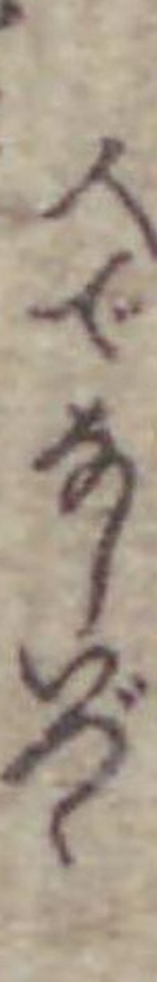人でなしいづく
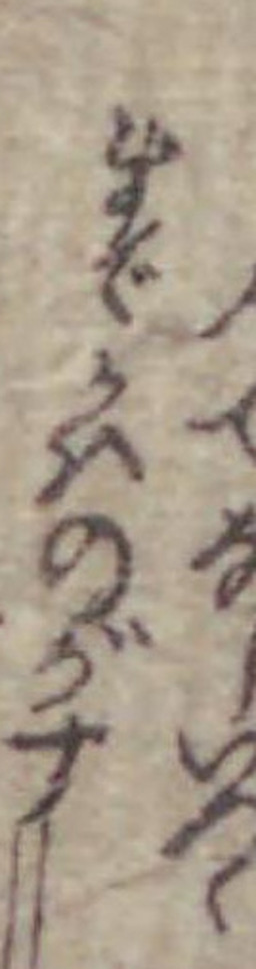までかはのがす
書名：嗚呼不侭世之助噺 : 3巻
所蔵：国立国会図書館 National Diet Library, JAPAN
